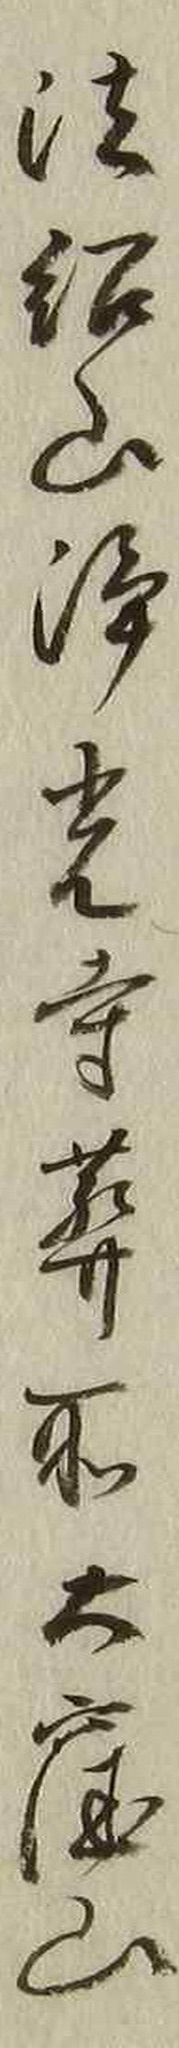法紹山浄光寺葬所大窪山
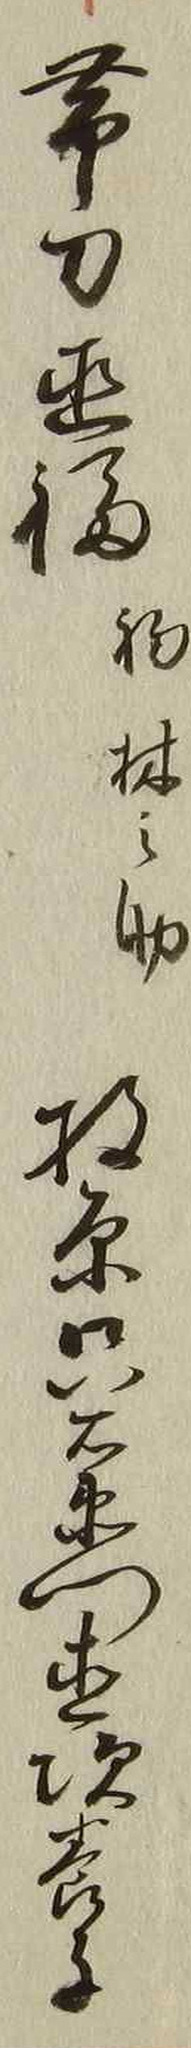帯刀直福初林之助牧原只右衛門直次養子
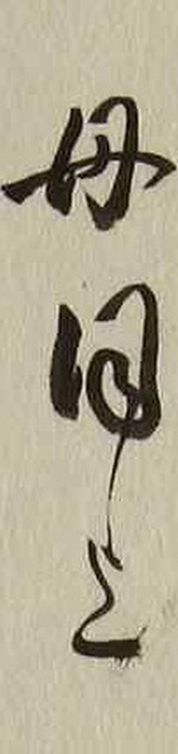母同上
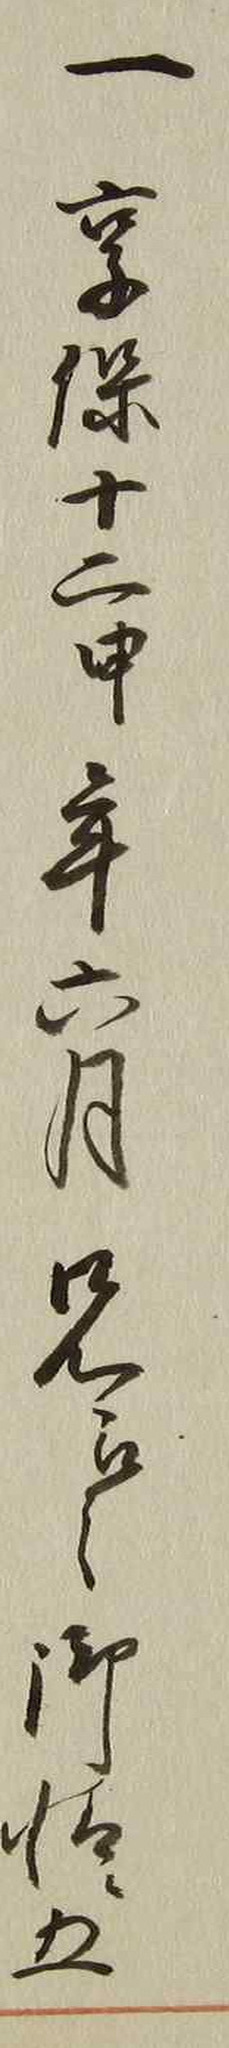一享保十二申年六月兄江之御情ニ五
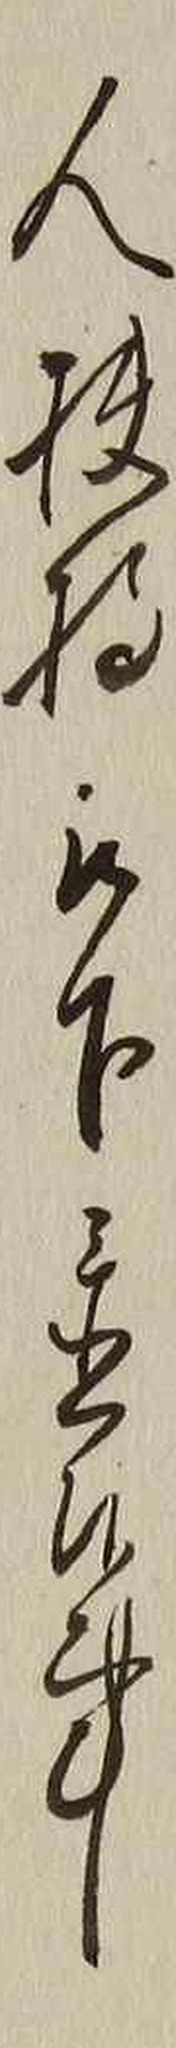人扶持被下置候事
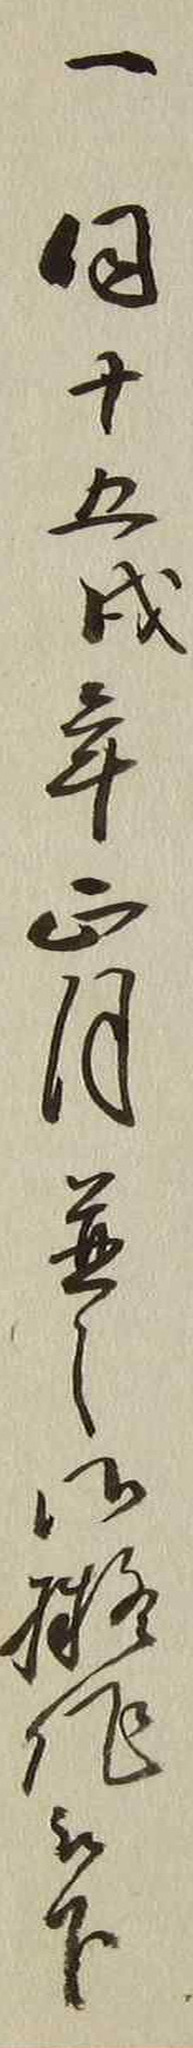一同十五戊年正月並之御擬作被下
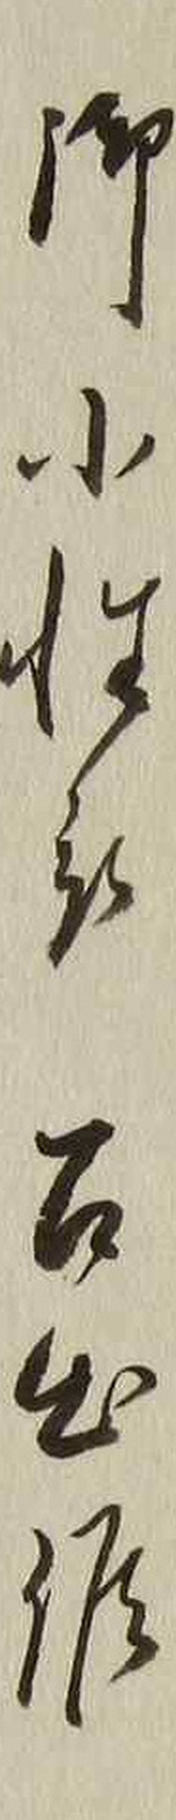御小性被召出候
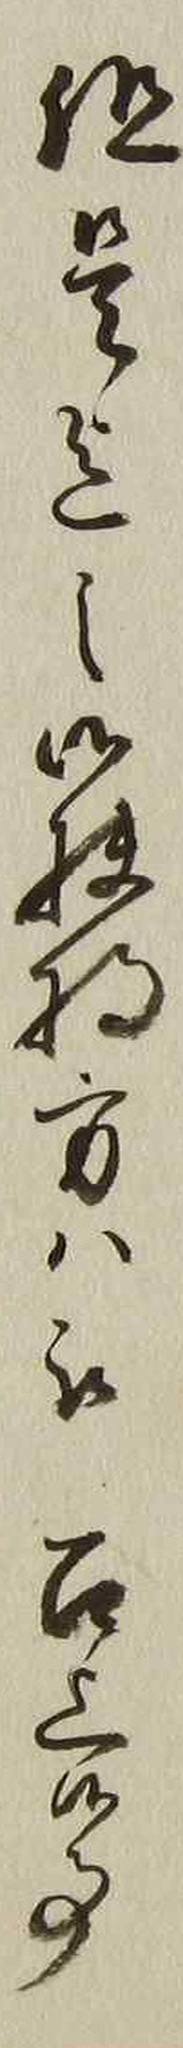但是迄之御扶持方ハ被召上候事
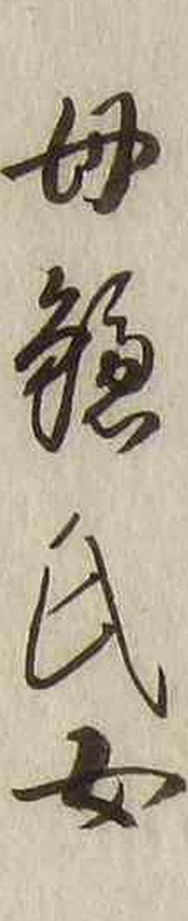母鱸氏女

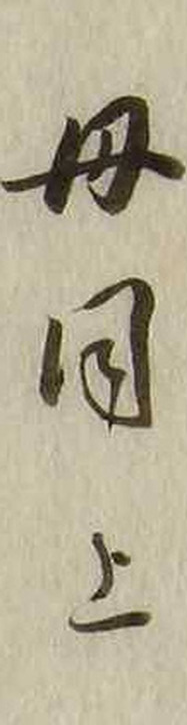母同上
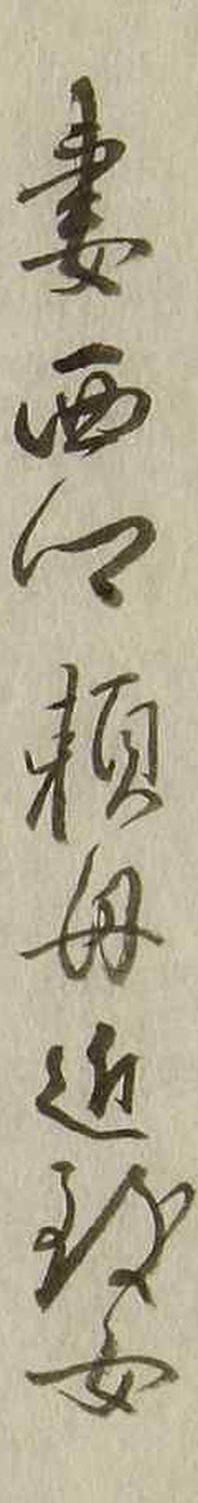妻西郷頼母近致女
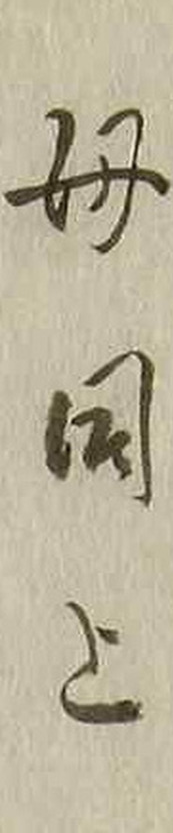母同上
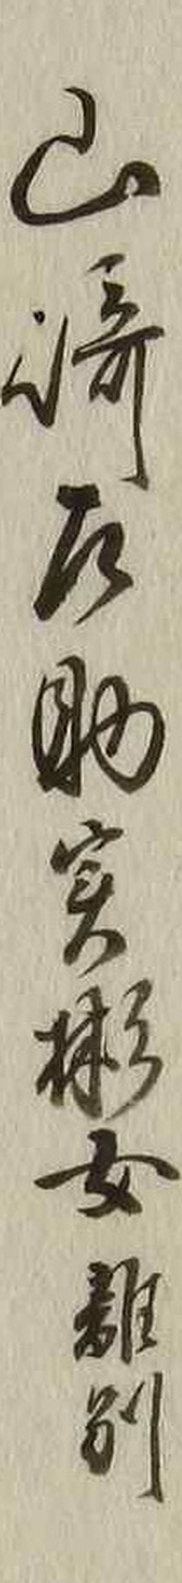山崎左助実彬女難別
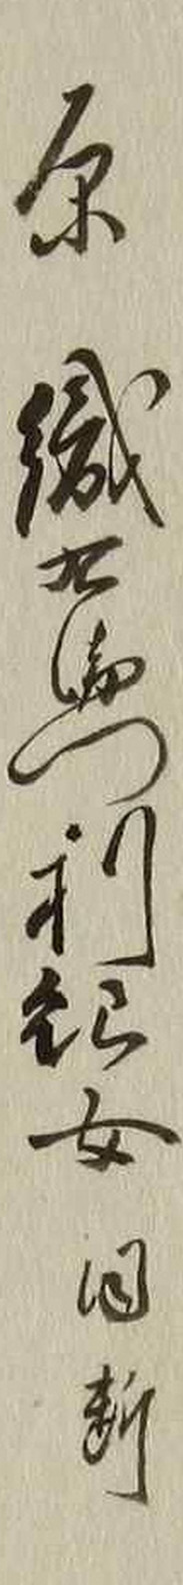原織右衛門利紀女同断
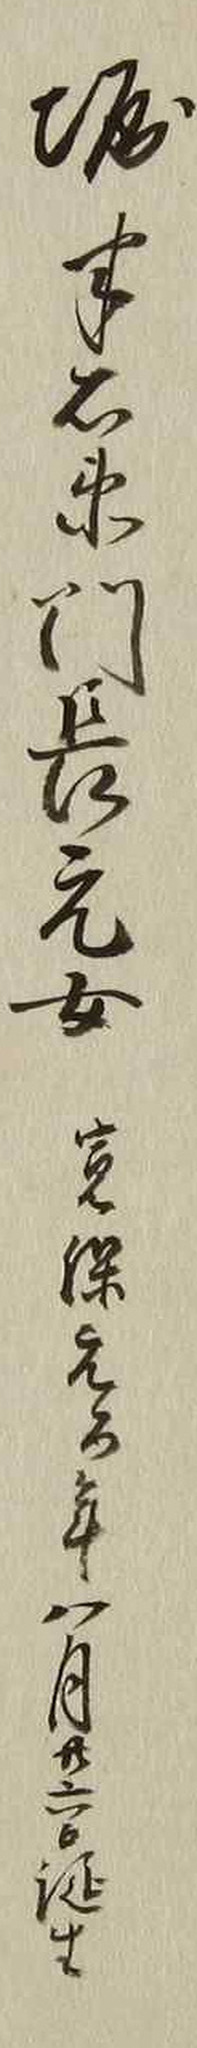堀半右衛門長元女寛保元酉年八月廿六日誕生
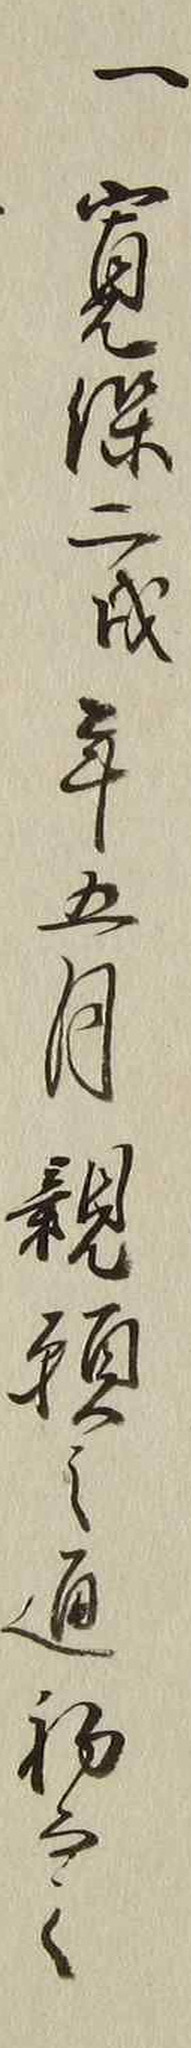一寛染二戌年五月親願之通初而之
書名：諸士系譜　巻之122　よ之部5
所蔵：会津若松市立会津図書館
